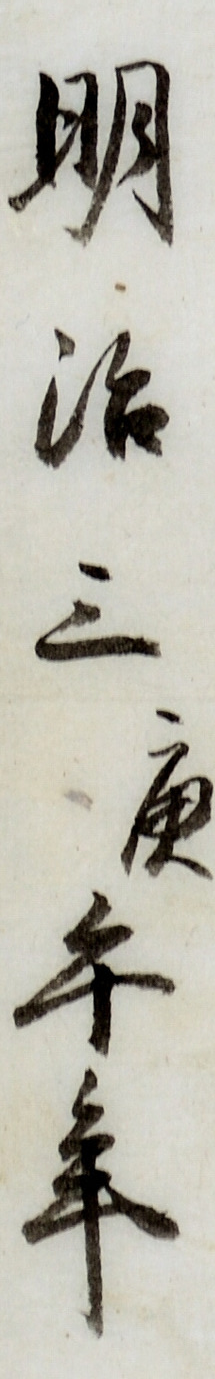明治三庚午年
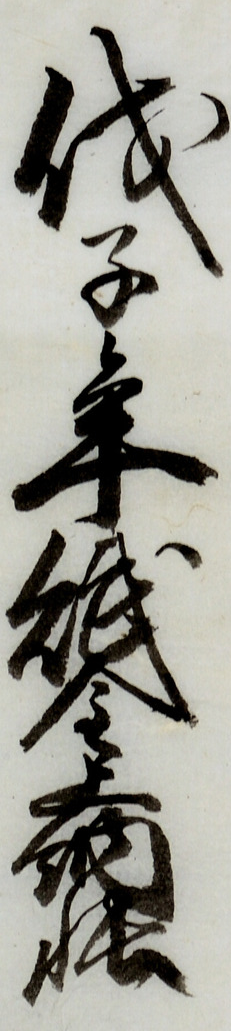伐子年賦金上納帳
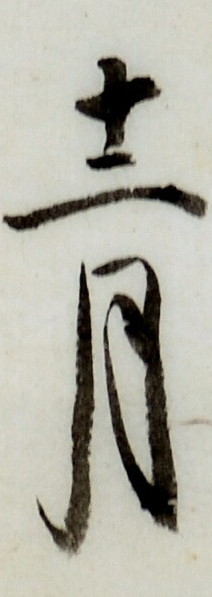十二月

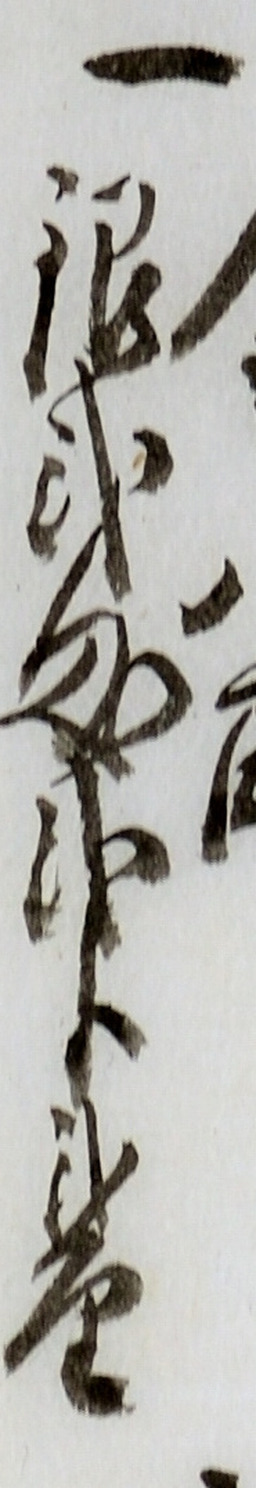銀弐匁弐分弐厘
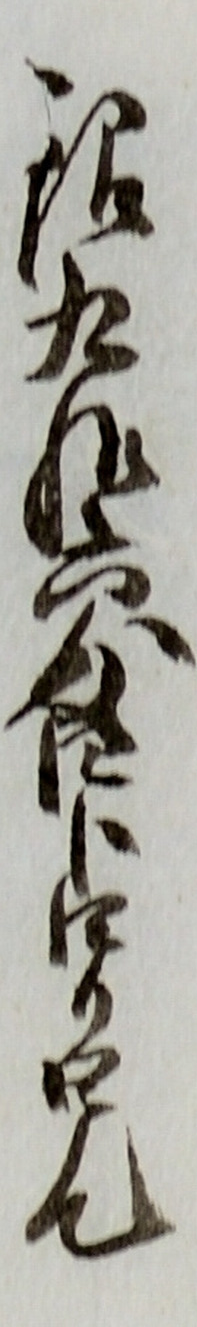銀九拾六匁四分四厘四毛酉年

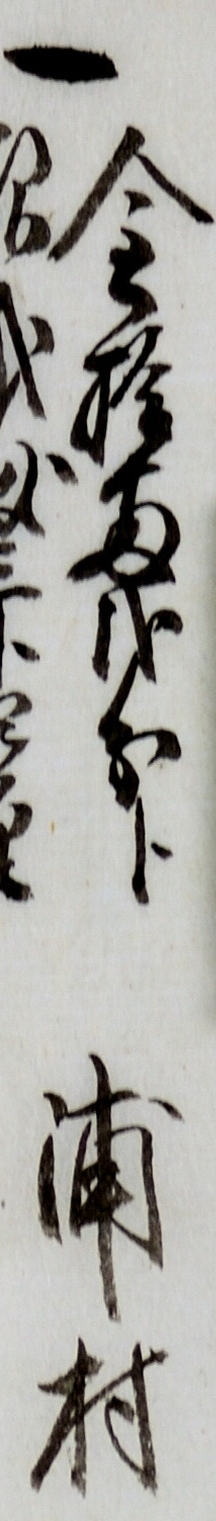一金拾両弐分ト浦村
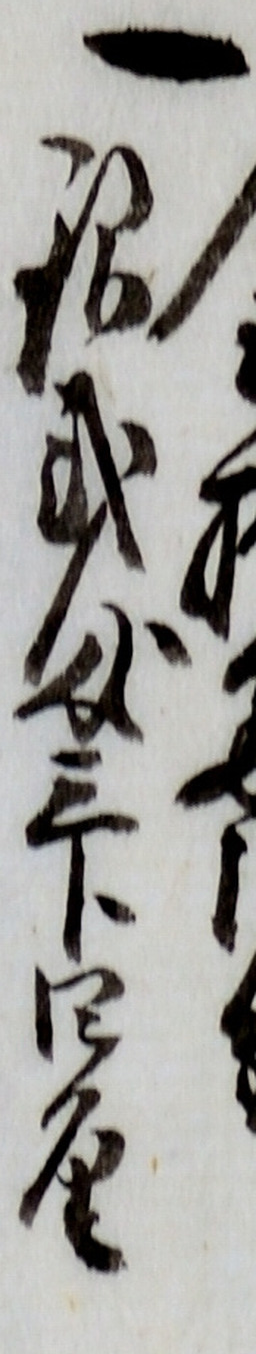銀弐匁三分四厘
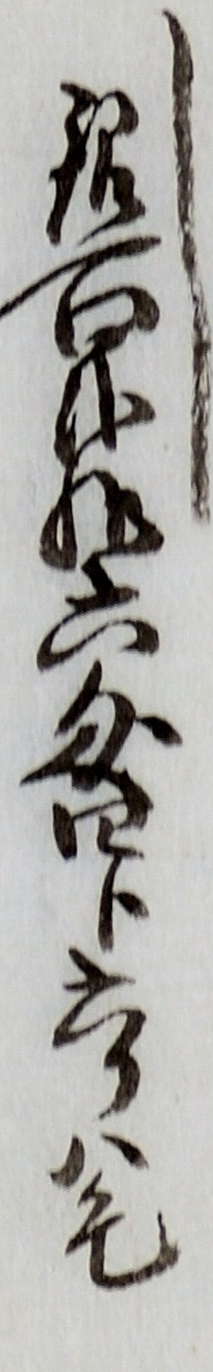銀百弐拾六匁四分六厘八毛午年
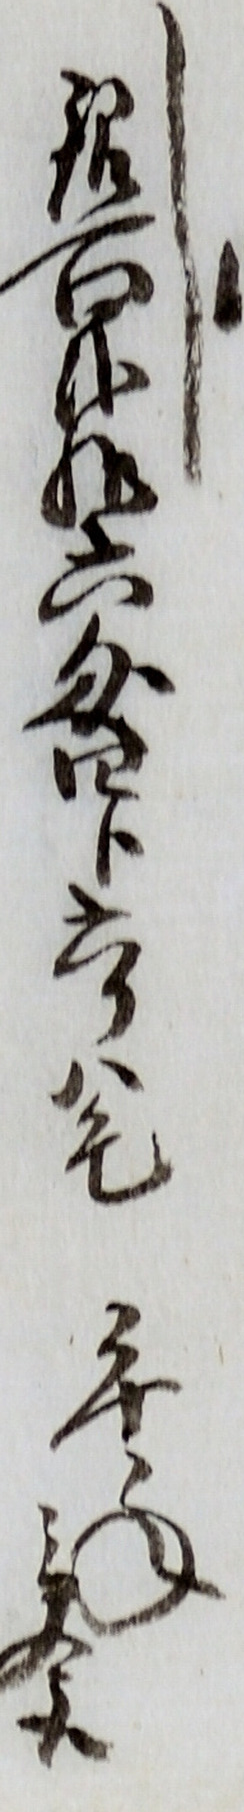銀百弐拾六匁四分六厘八毛午年
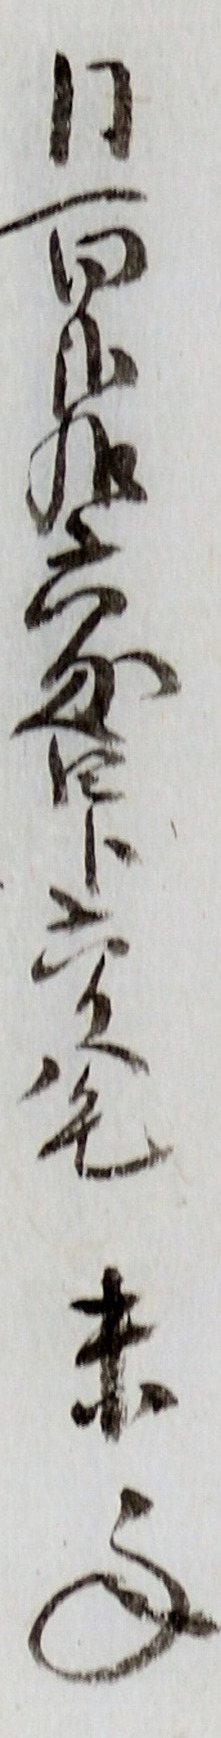同百弐拾六匁四分六厘八毛未年
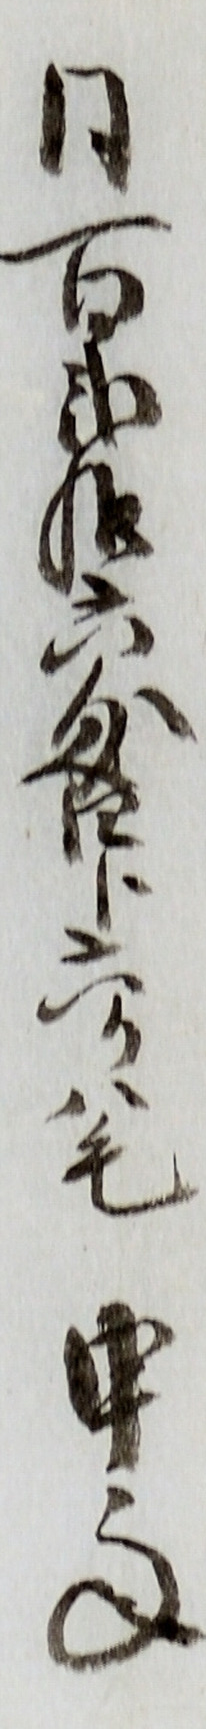同百弐拾六匁四分六厘八毛申年
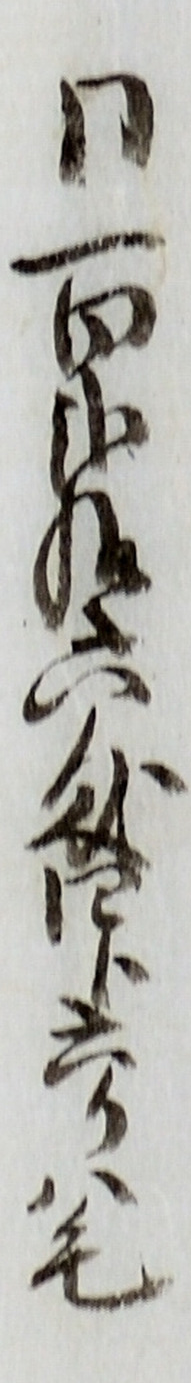同百弐拾六匁四分六厘八毛未年
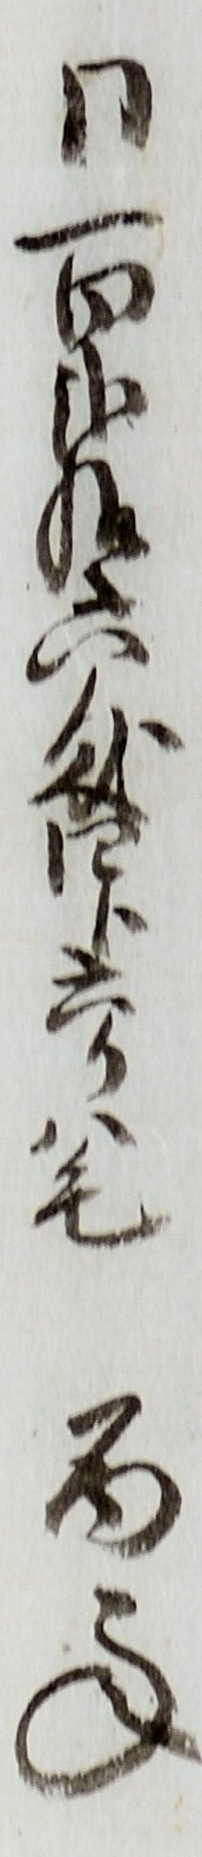同百弐拾六匁四分六厘八毛酉年
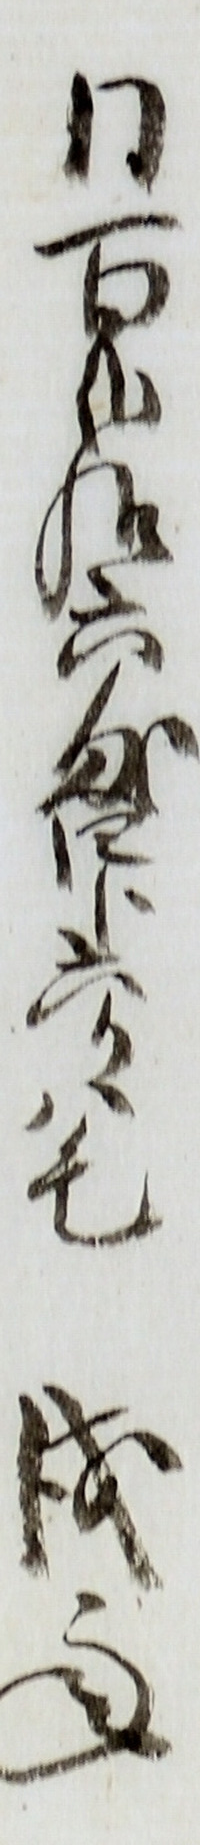同百弐拾六匁四分六厘八毛戌年
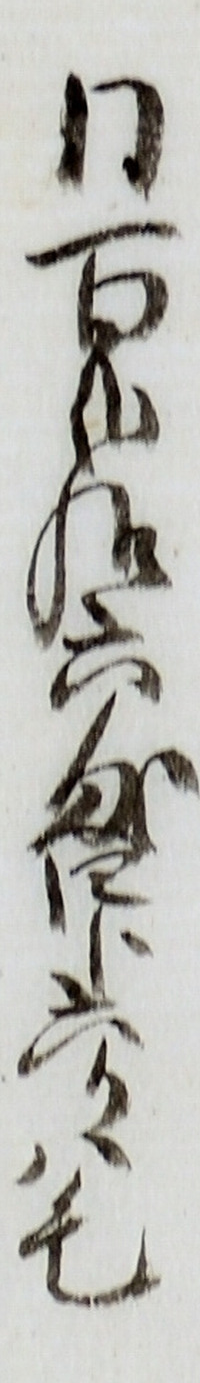同百弐拾六匁四分六厘八毛未年
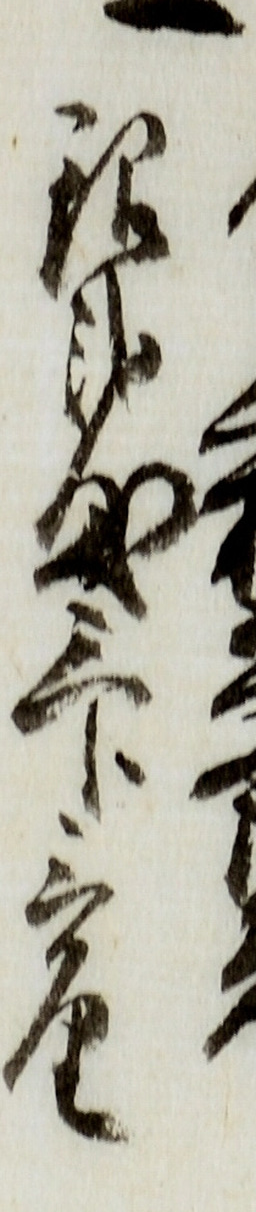銀弐匁三分三厘
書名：伐子年賦金上納帳
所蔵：伊那市立高遠町図書館・合同会社AMANE
